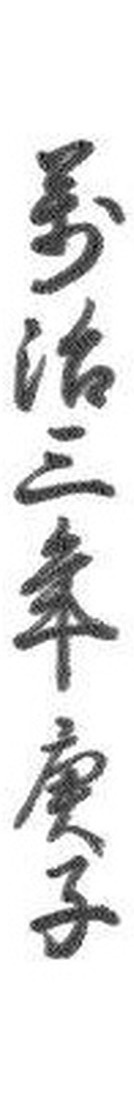万治三年庚子
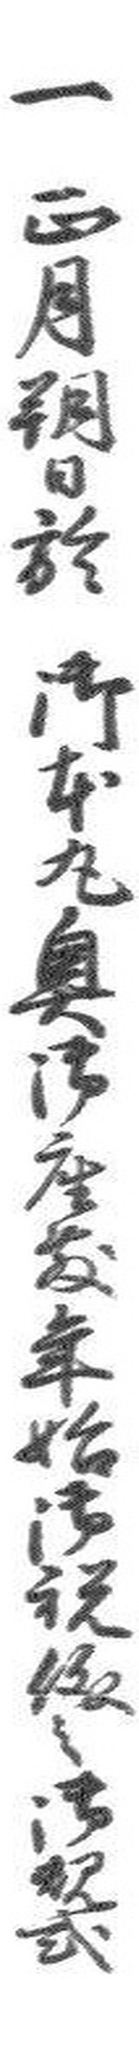一正月朔日於御本丸奥御座敷年始御祝儀之御規式
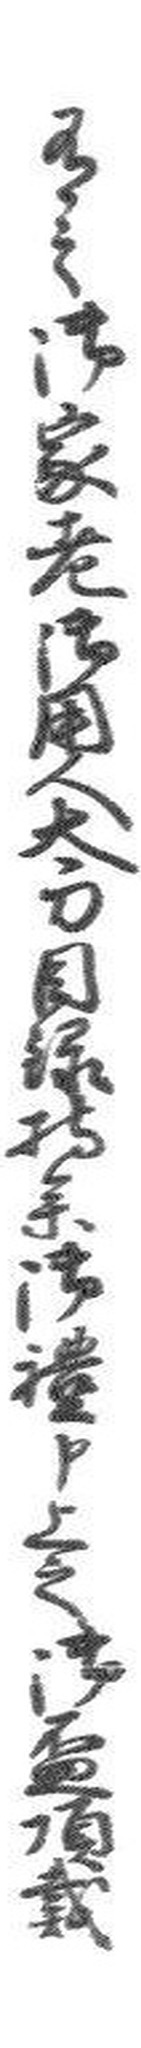有之御家老御用人太刀目録持参御礼申上之御盃頂戴
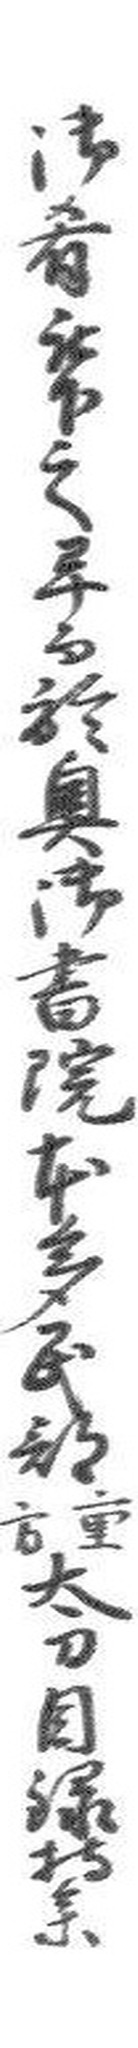御肴被下之畢而於奥御書院本多民部重方太刀目録持参
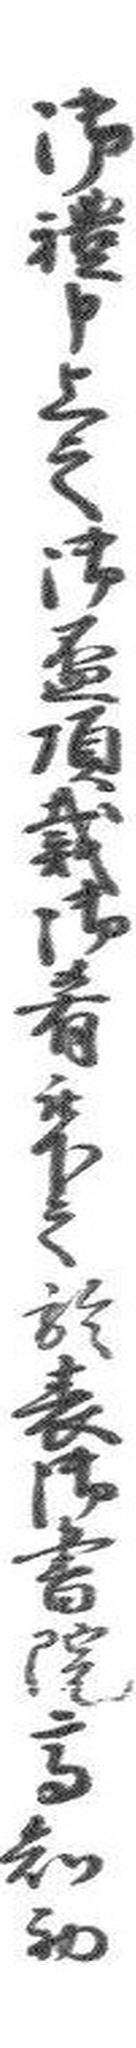御礼申上之御盃頂戴御肴被下之於表御書院高知初
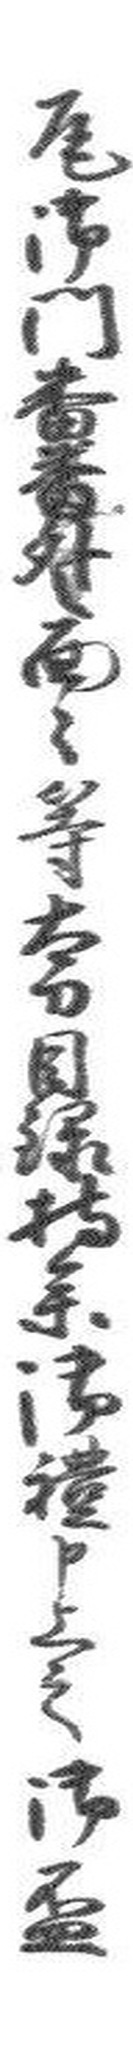瓦御門番番外之面々等太刀目録持参御礼申上之御盃
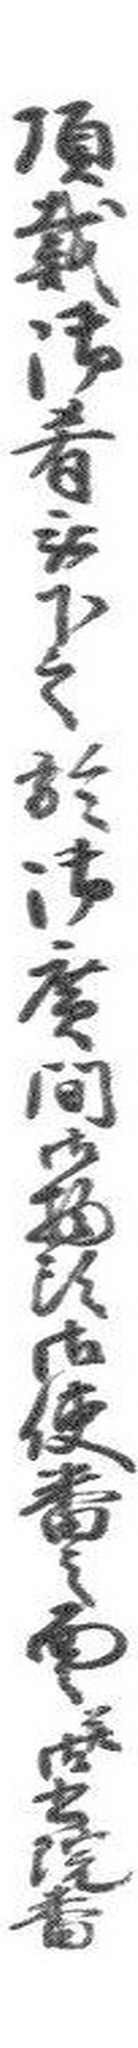頂戴御肴被下之於御広間御物頭御使番之面々并御書院番
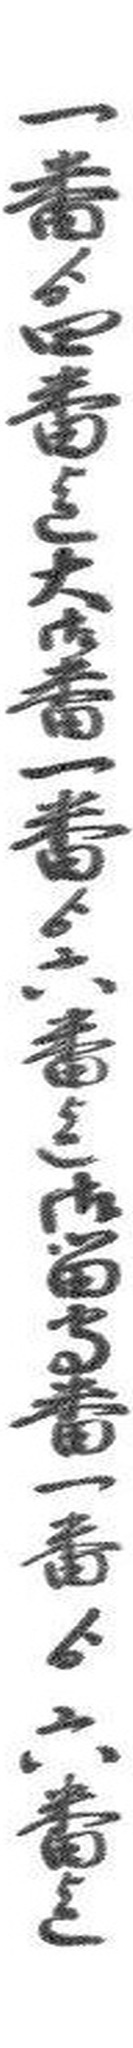一番ゟ四番迄大御番一番ゟ六番迄御留守番一番ゟ六番迄

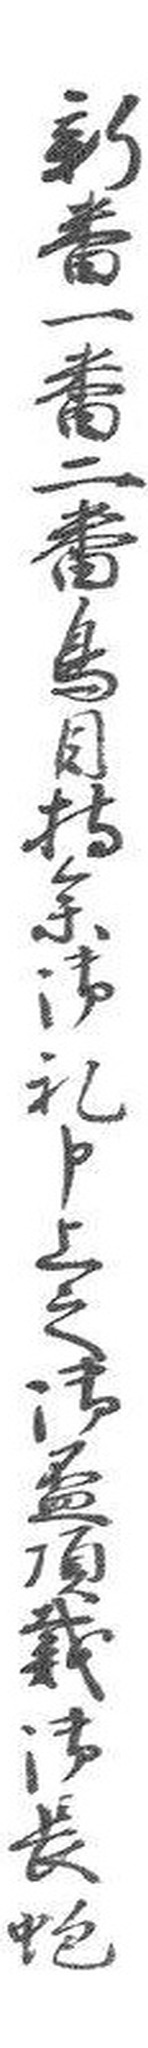新番一番二番鳥目持参御礼申上之御盃頂戴御長蚫
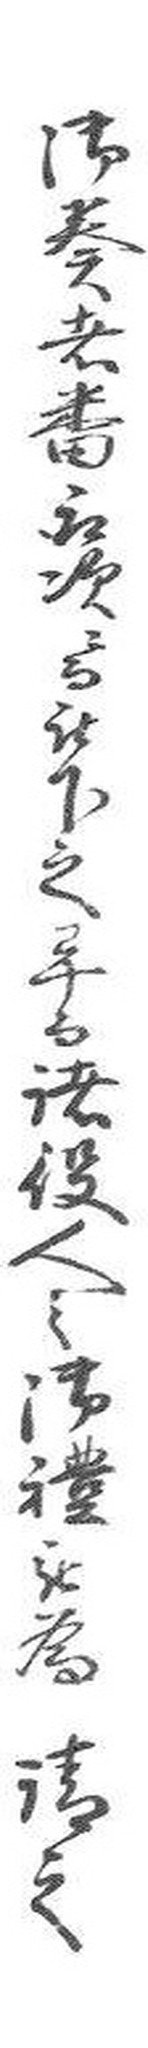御奏者番取次ニ而被下之畢而諸役人之御礼被為請之
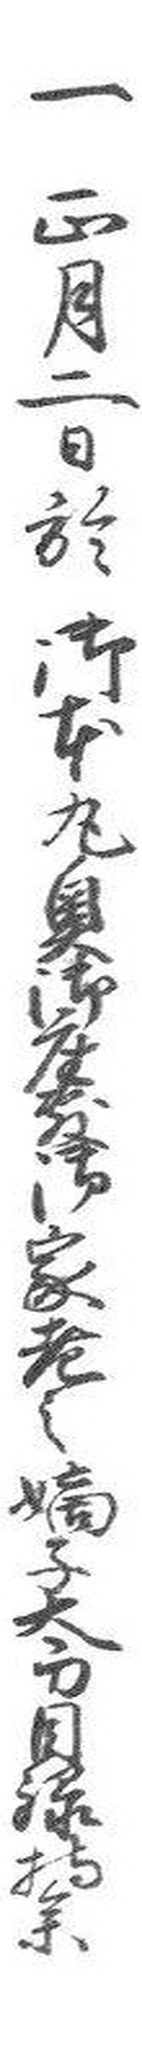一正月二日於御本丸奥御座敷御家老之嫡子太刀目録持参
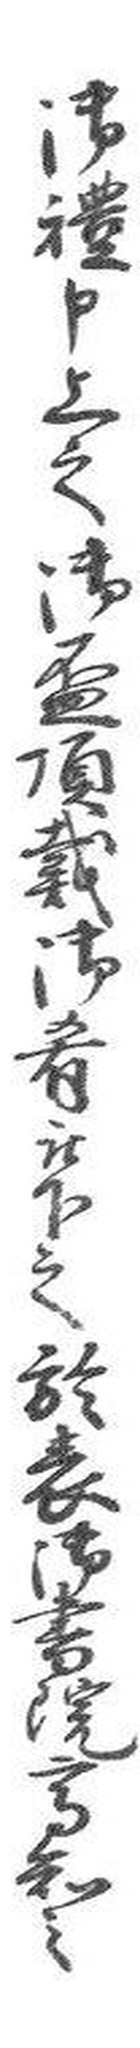御礼申上之御盃頂戴御肴被下之於表御書院高知之
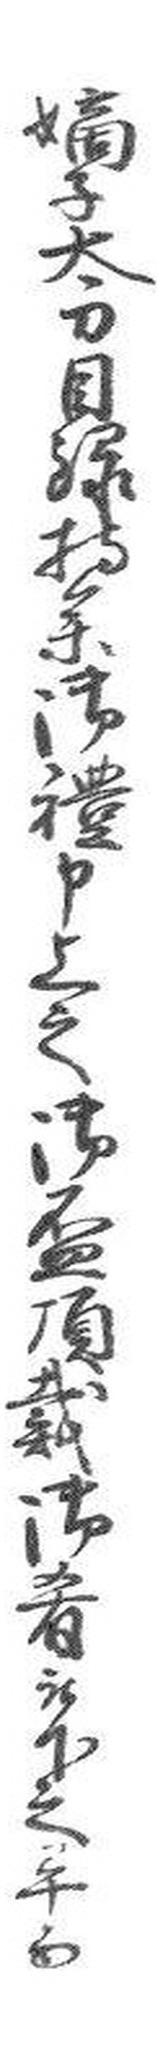嫡子太刀目録持参御礼申上之御盃頂戴御肴被下之畢而
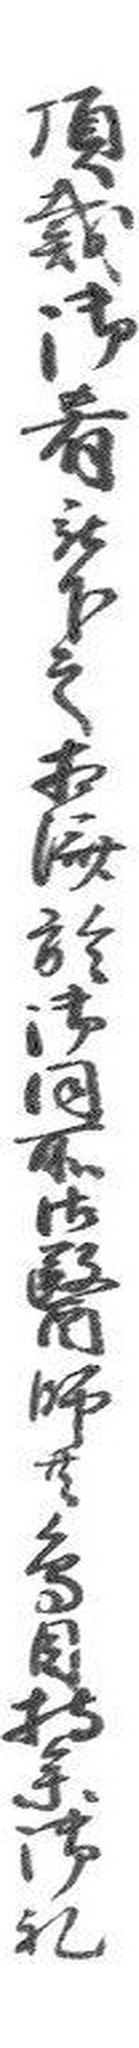頂戴御肴被下之相済於御同所御医師共鳥目持参御礼
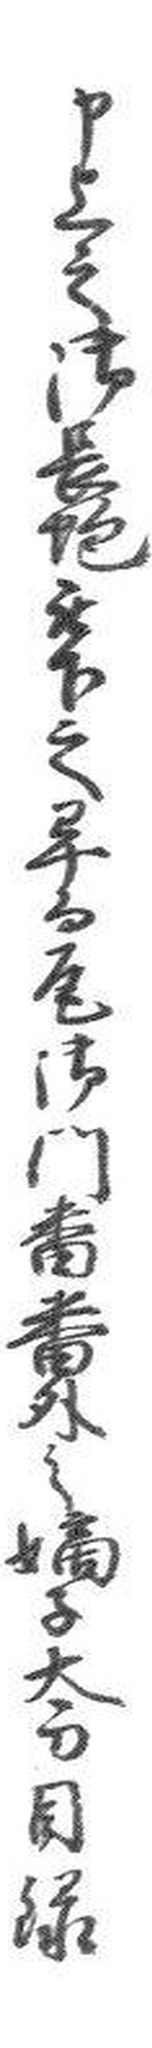申上之御長蚫被下之畢而瓦御門番番外之嫡子太刀目録
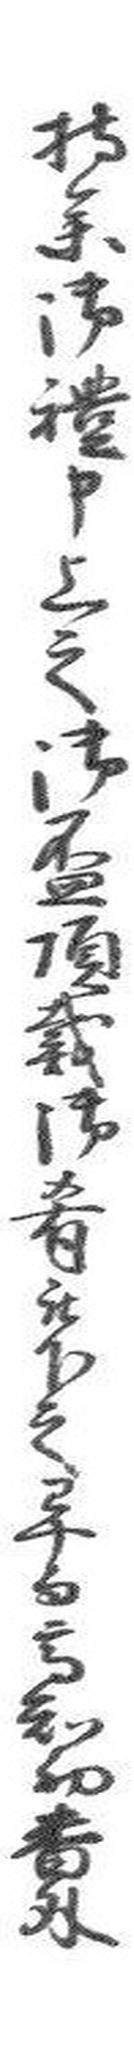持参御礼申上之御盃頂戴御肴被下之畢而高知初番外
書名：家譜 六 光通公 従万治三年到寛文三年
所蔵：福井県文書館 Fukui Prefectural Archives
